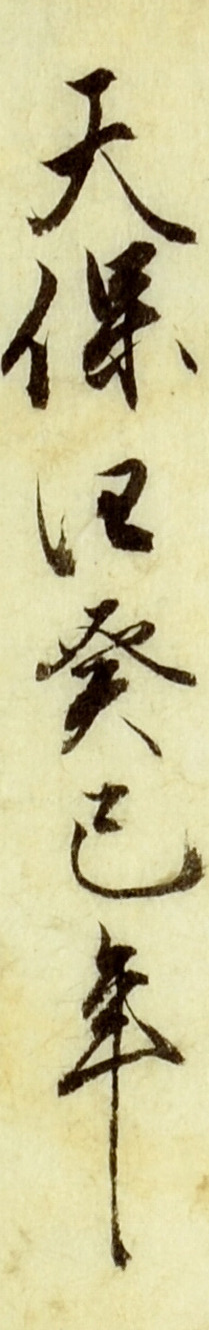天保四癸巳年
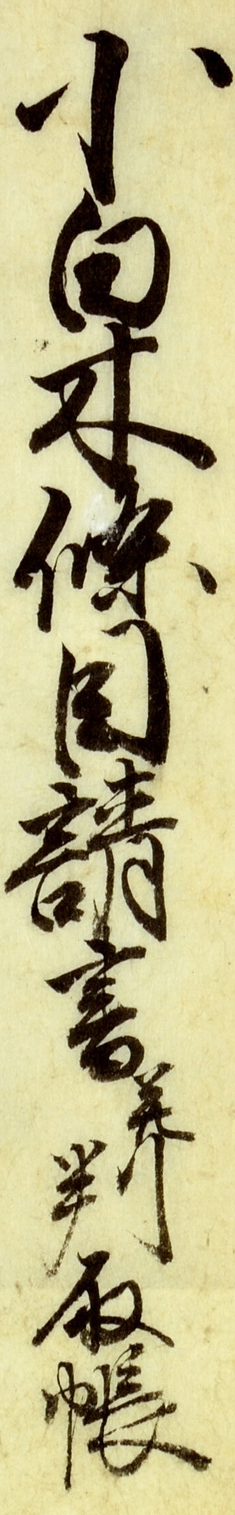小白木條目請書并判取帳

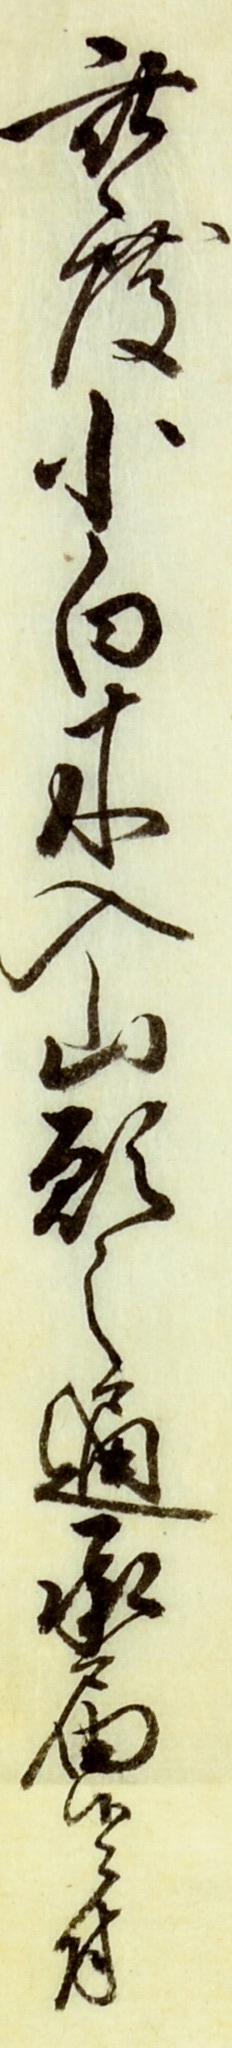此度小白木入山願之通承届候ニ付
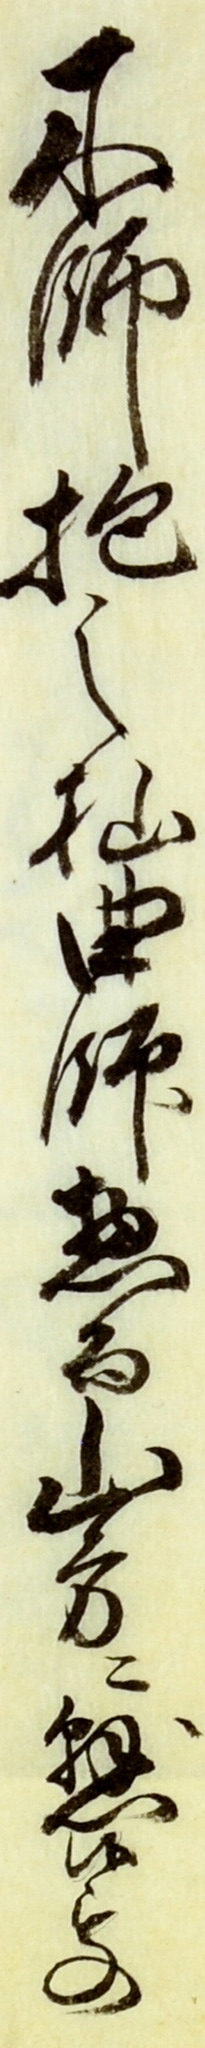木師抱之杣曲師惣而山方ニ懸候もの
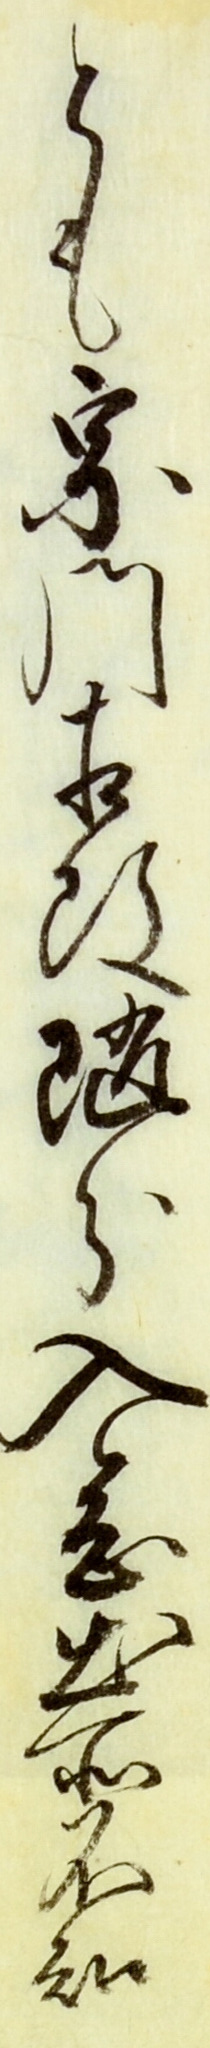とも宗門相改随分入念出所不知
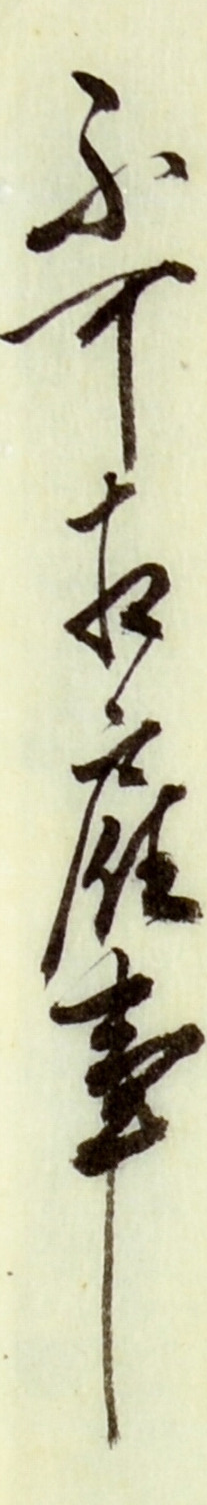不可相雇事
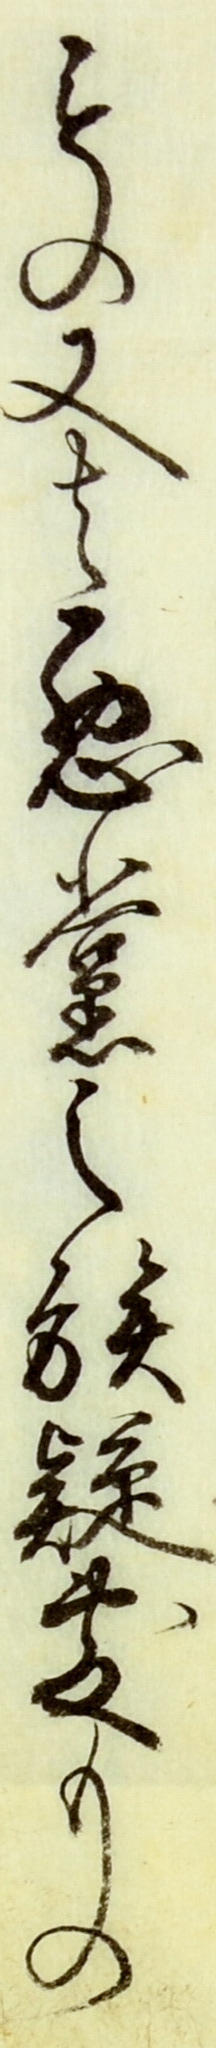もの又者あ悪党之族疑敷もの

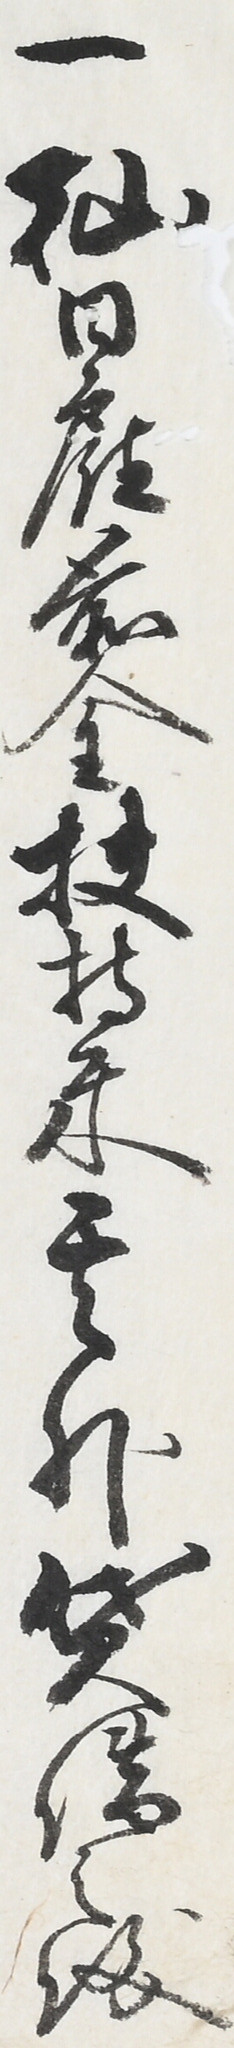一杣日雇前金扶持米其外貸借之儀
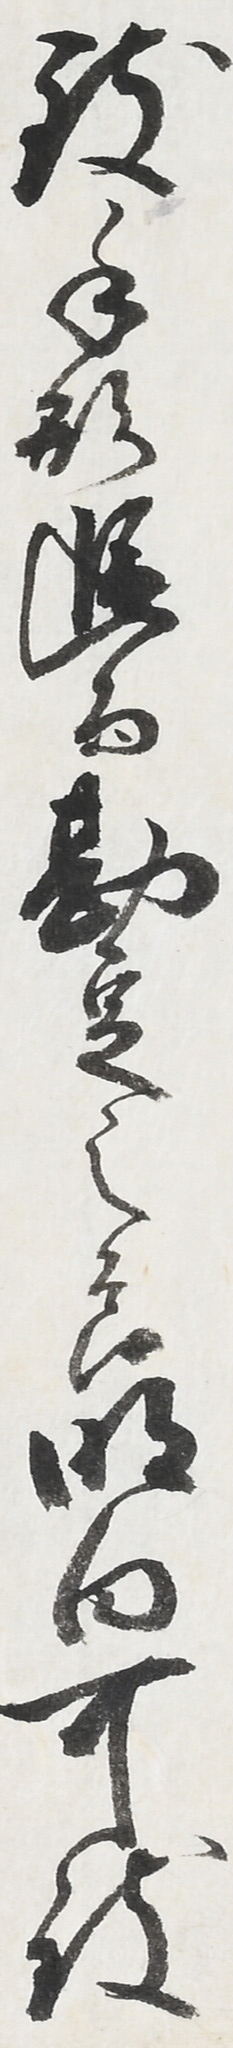致手形追而勘定之節明白可致
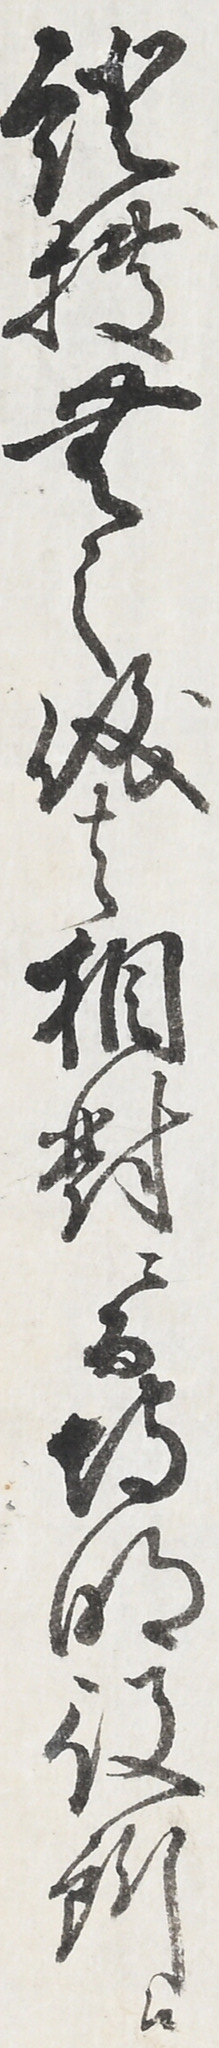証拠無之儀者相対ニ而埒明役所江
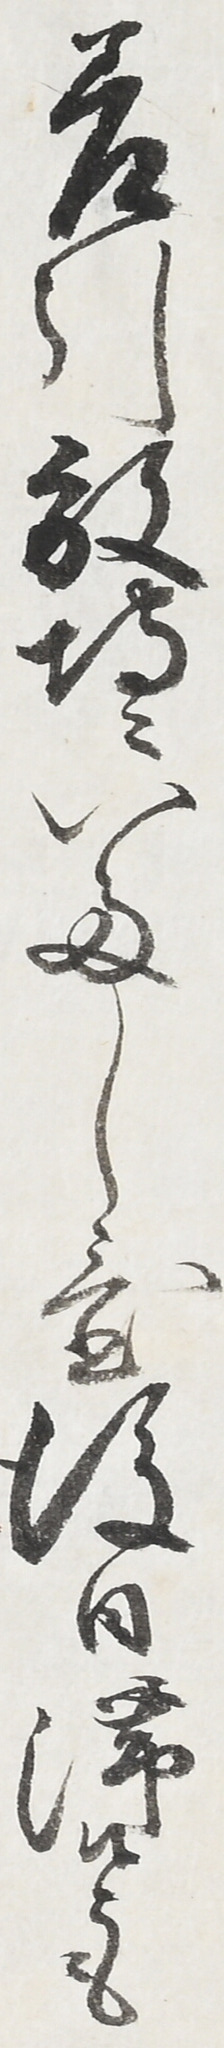差引放埒ニいたし置後日滞候とも
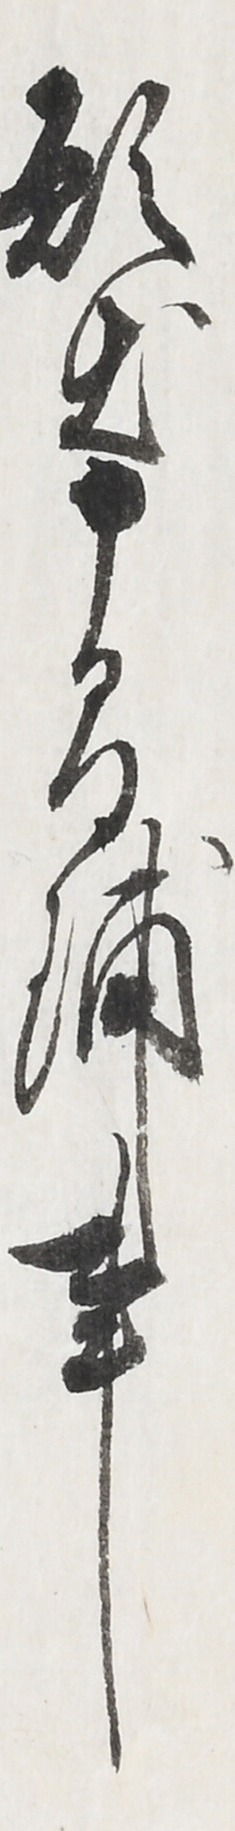願出申間敷事
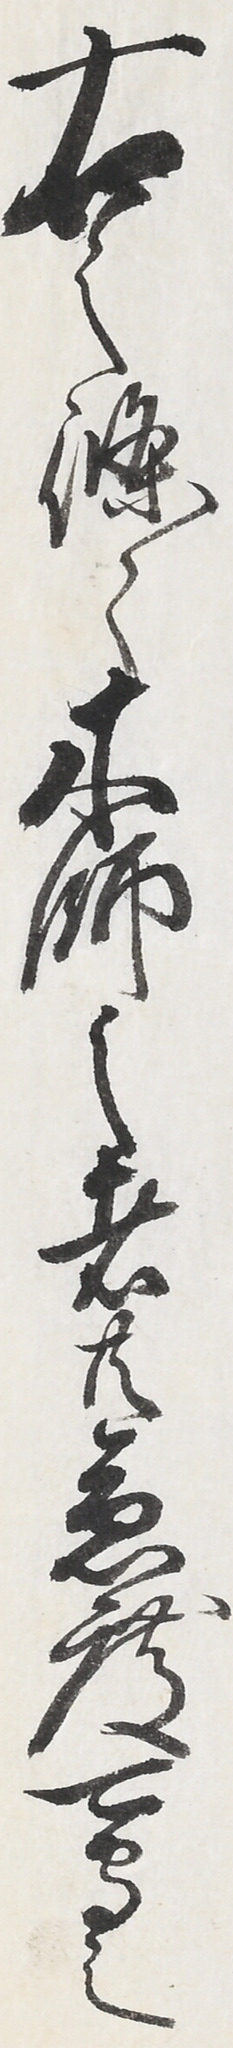右之條々木師之者共急度可守之
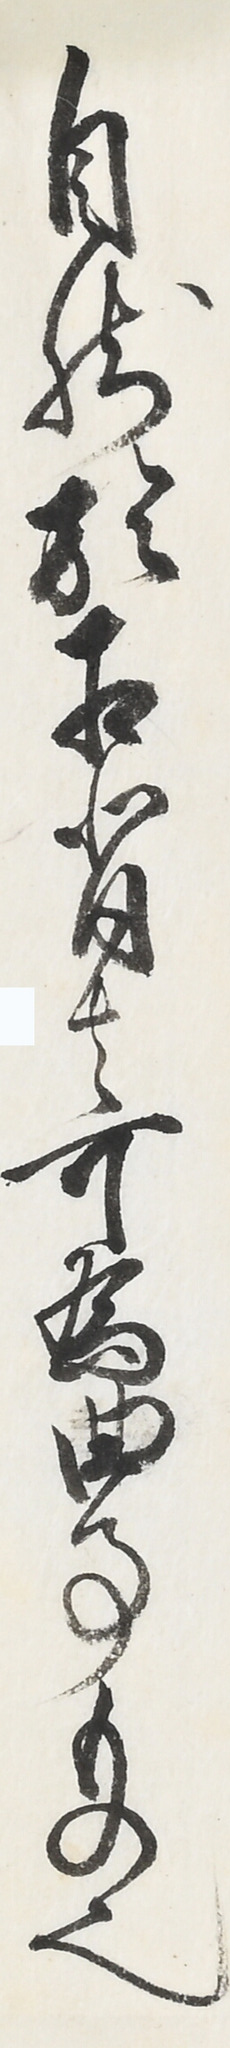自然於相背者可為曲事もの也
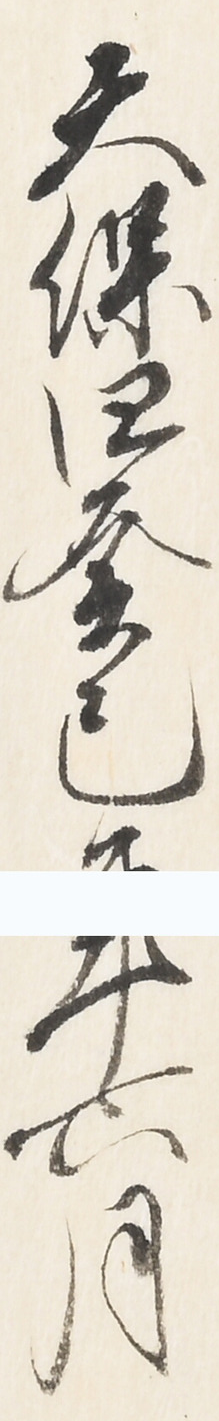天保四癸巳年六月
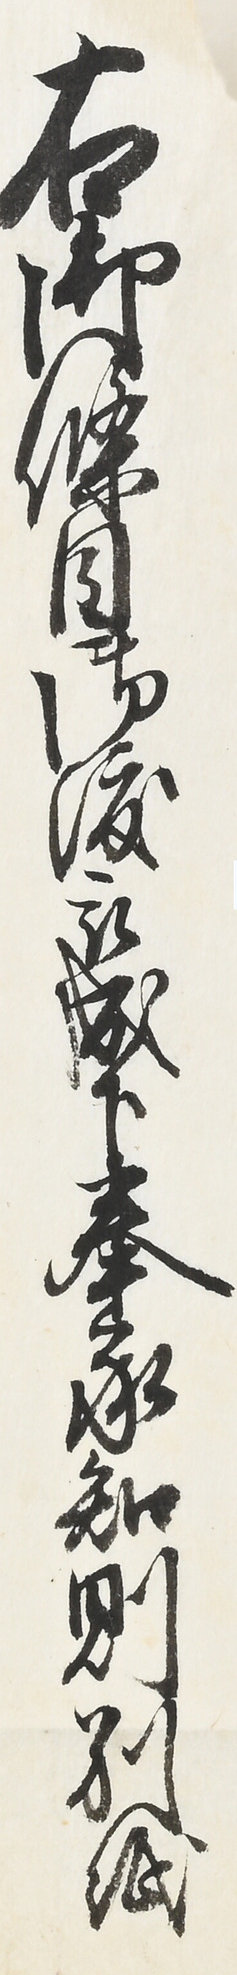右御條目御渡被成下奉承知則別紙
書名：小白木條目請書并判取帳
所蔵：伊那市立高遠町図書館・合同会社AMANE
